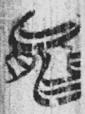能
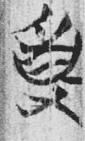事
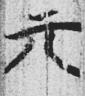亓（其）
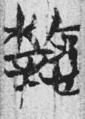○（親）
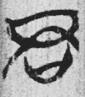君
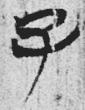子
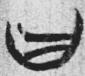曰
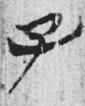子
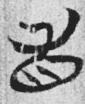眚（姓）
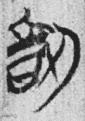割（蓋）
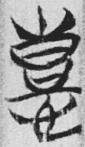憙（喜）
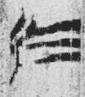於
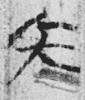內
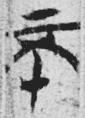不
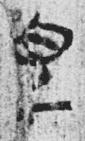見
